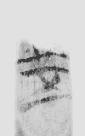{廿五}
